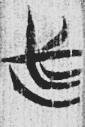必
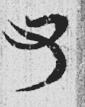又（有）
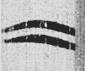二
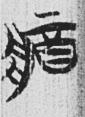𨟻（將）
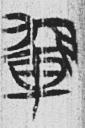軍
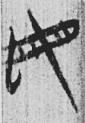母（無）
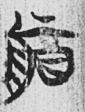𨟻（將）
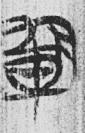軍
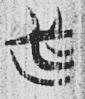必
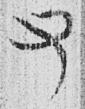又（有）
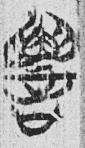○（數）
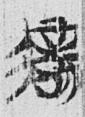獄
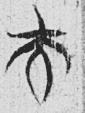大夫
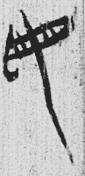母（無）
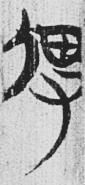俾（裨）
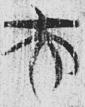大夫
